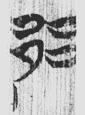郘
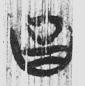昌
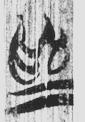爲
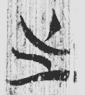之
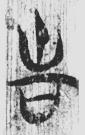告
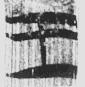王
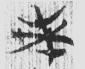未
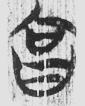合（答）
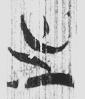之
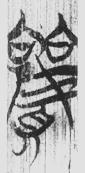觀
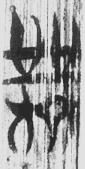無
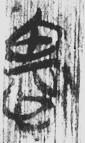愄（畏）
